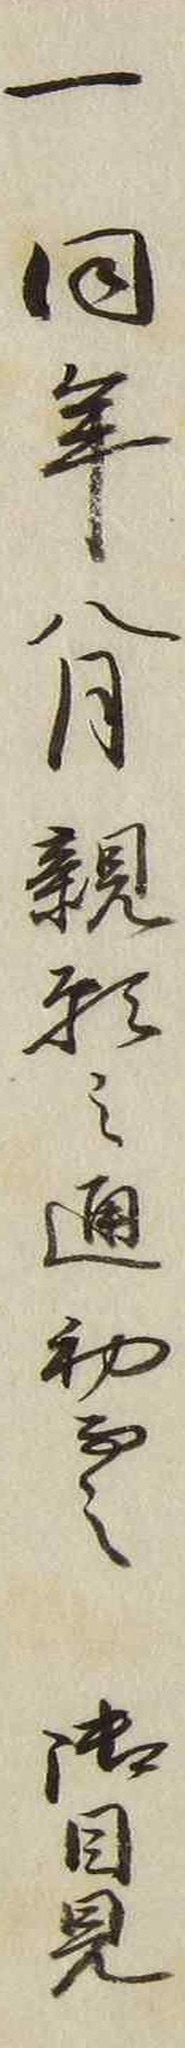一同年八月親願之通初而之御目見

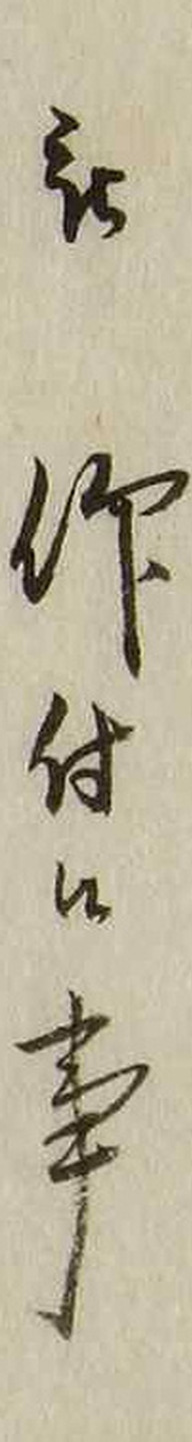被仰付候事
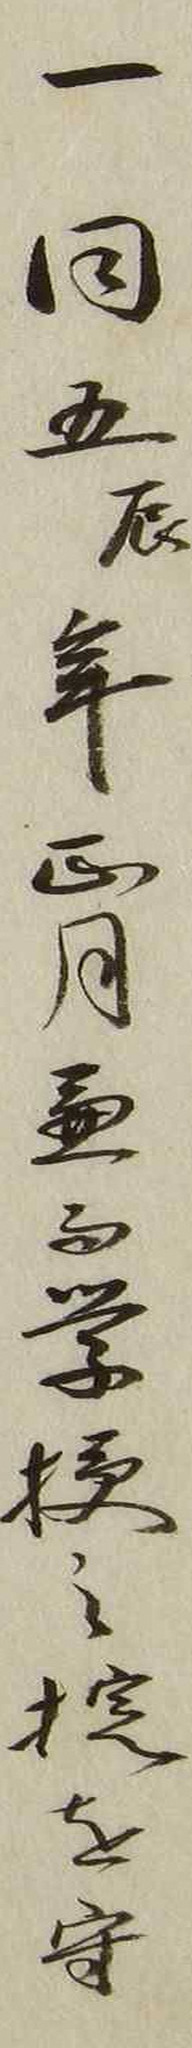一同五辰年正月兼而学校之掟を守
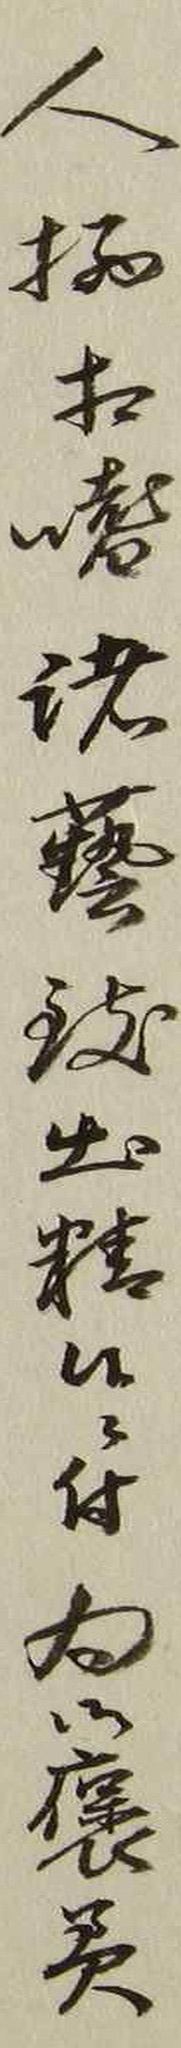人柄相嗜諸芸致出精候ニ付為御褒美
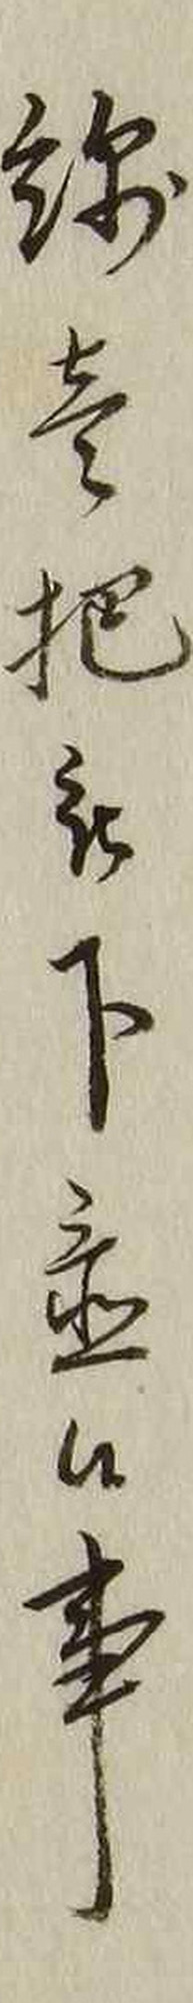綿壱把被下置候事
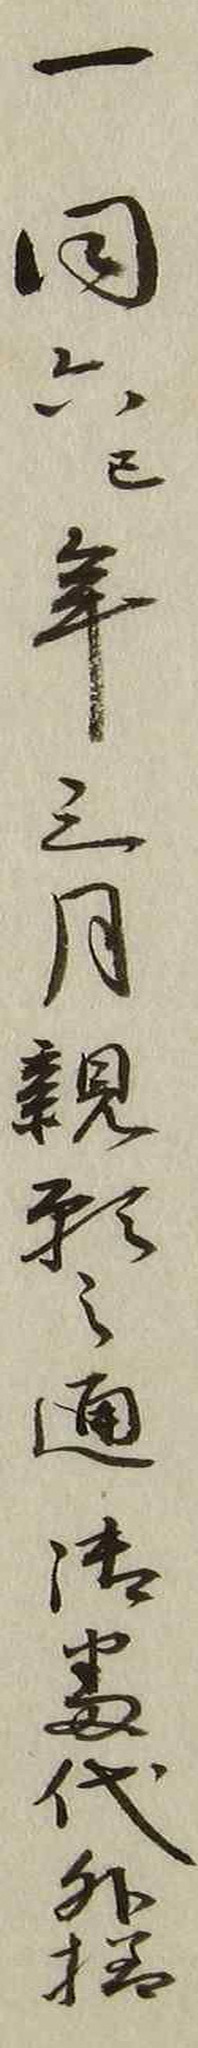一同六巳年三月親願之通御番代外様
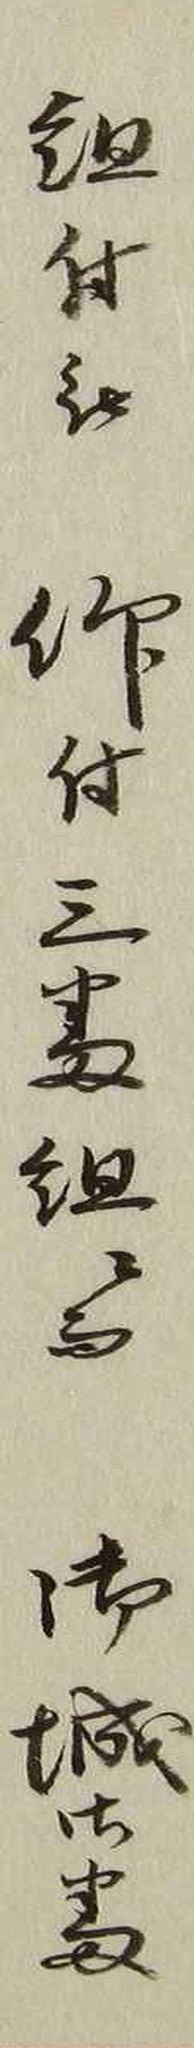組付被仰付三番組ニ而御城御番
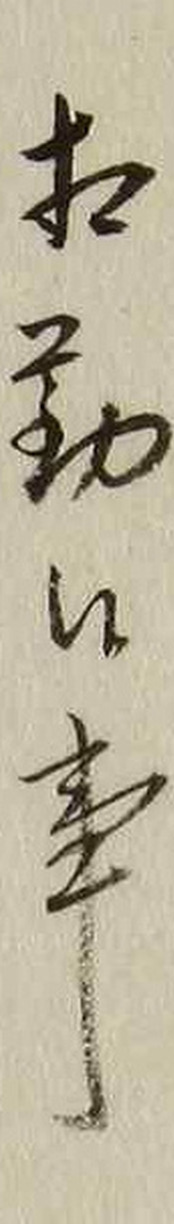相勤候事
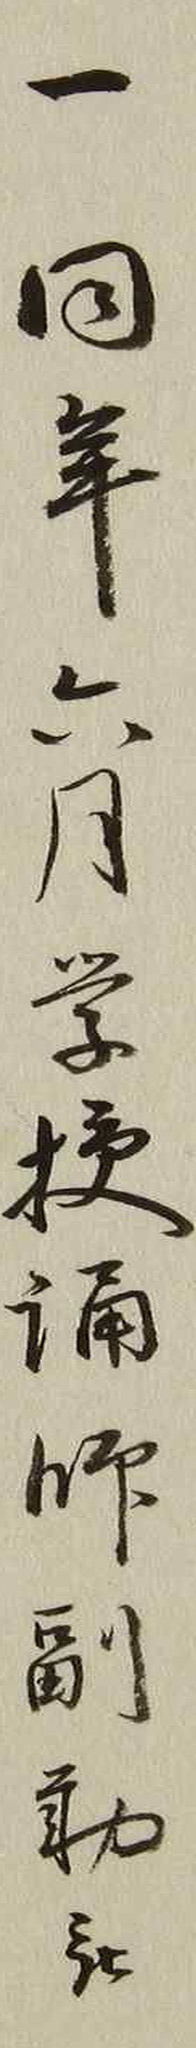一同年六月学校誦師副勤被
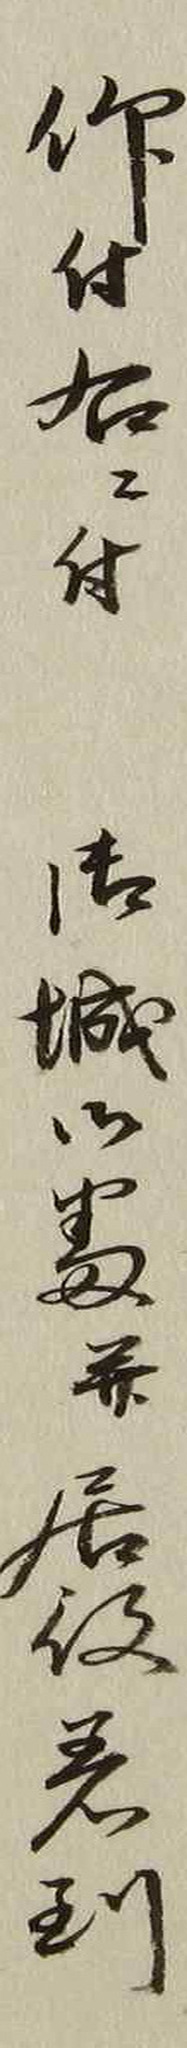仰付右ニ付御城御番并居役着到
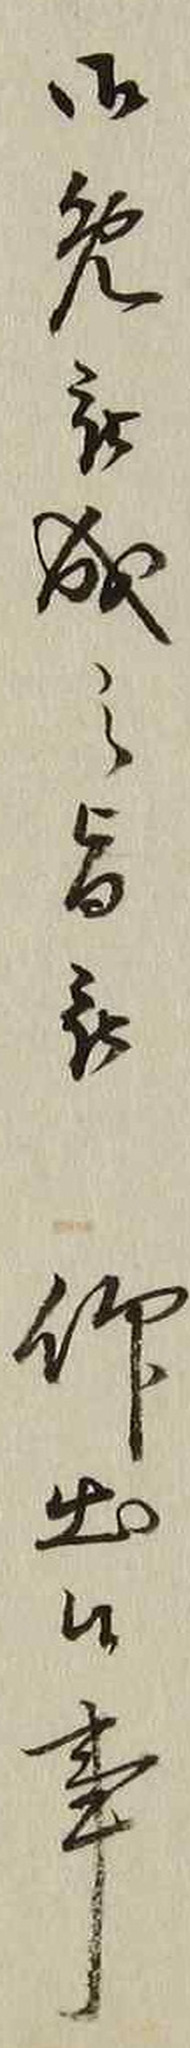御免被成之旨被仰出候事
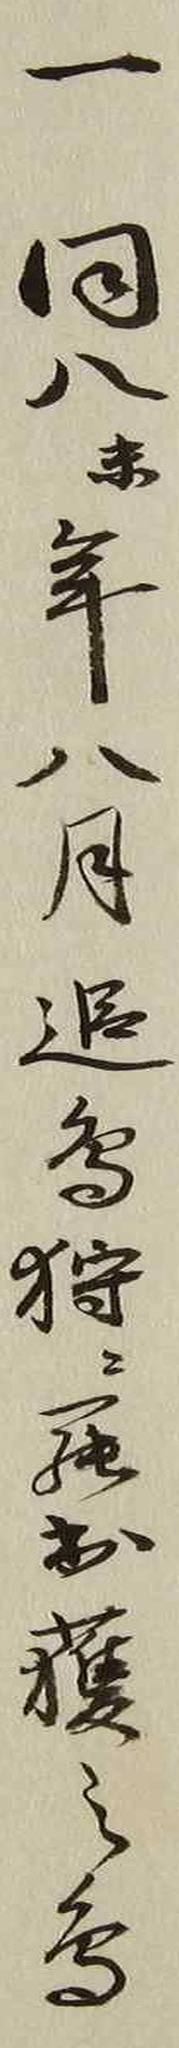一同八未年八月追鳥狩ニ罷出獲之鳥
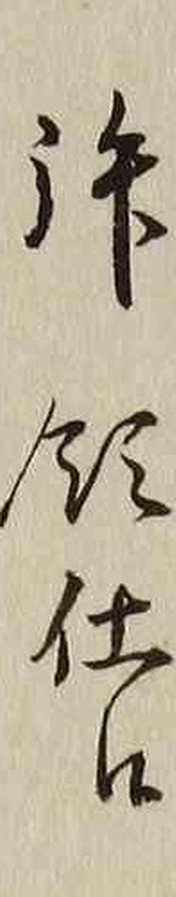拝領仕候
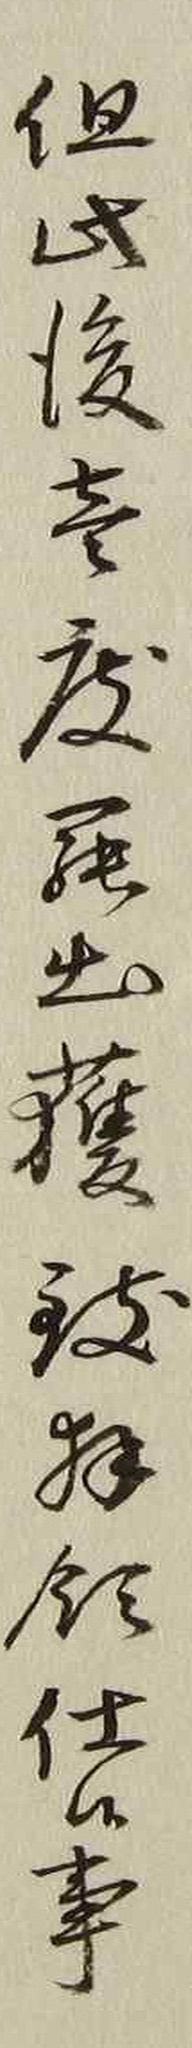但此後壱度罷出獲致拝領仕候事
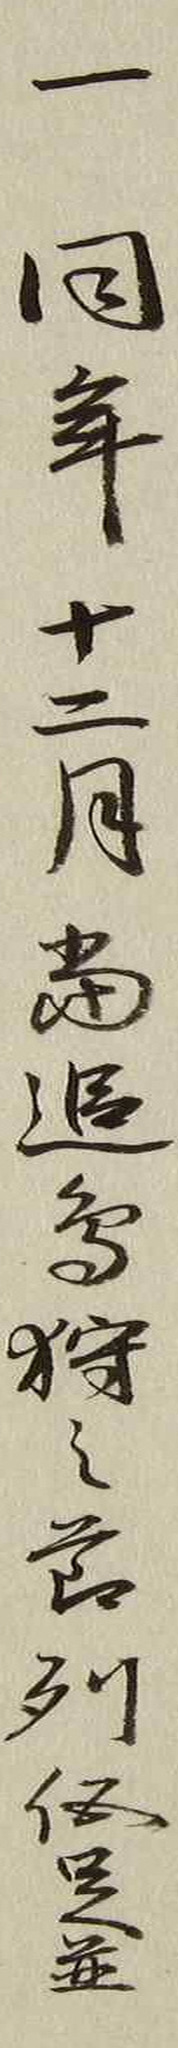一同年十二月当追鳥狩之節列伍足並
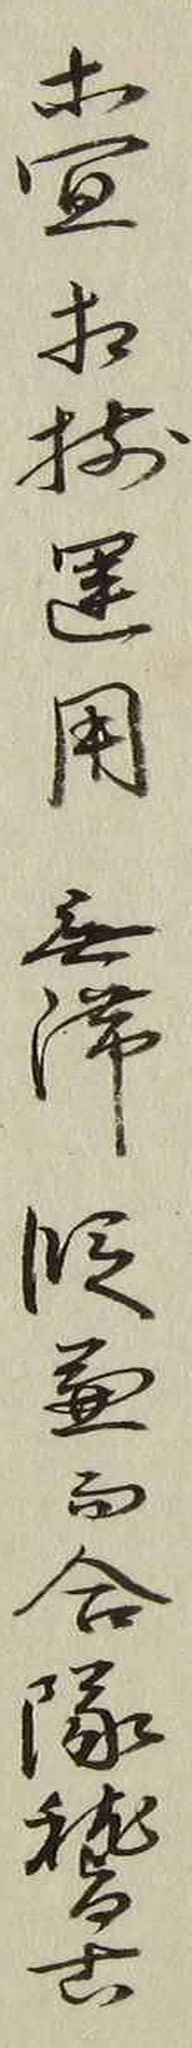等宜相揃運用無滞段兼而合隊稽古
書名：諸士系譜　巻之149　そ之部2
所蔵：会津若松市立会津図書館
